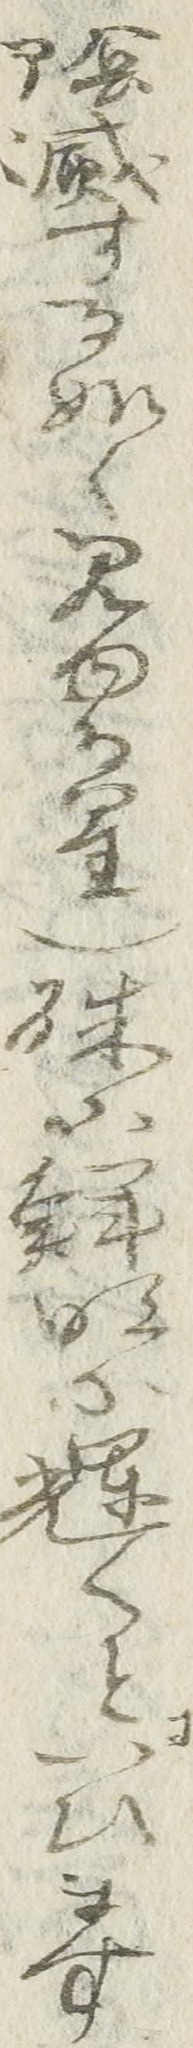陰滅する如く見ゆる星）殊に鮮明に輝くといひます
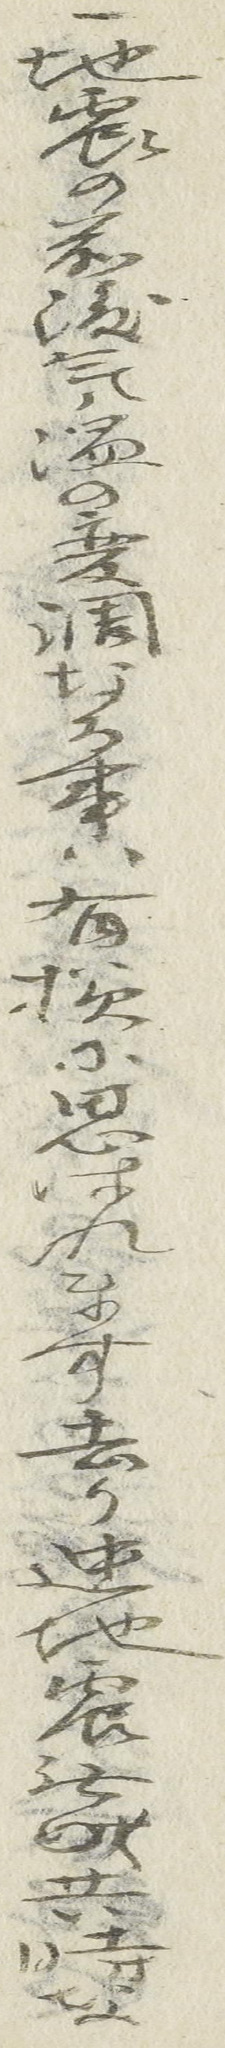一地震の前後気温の変調なる事は有様に思はれます去り迚地震無わ共時な
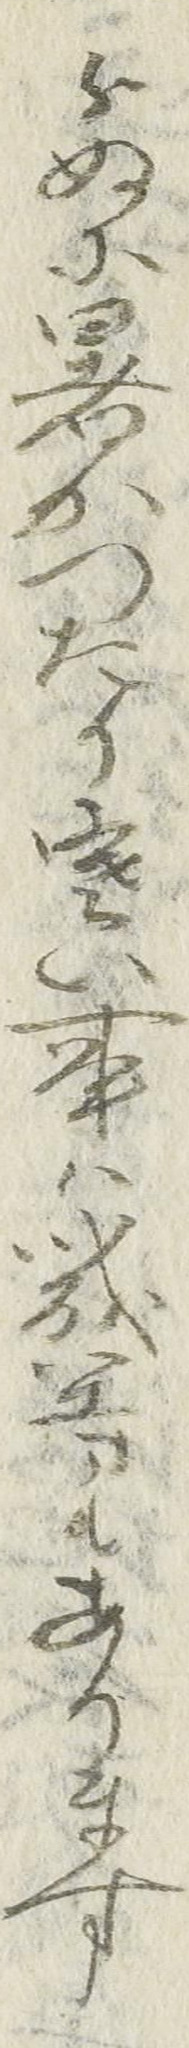らぬに暑かつたり寒い事は幾等もあります
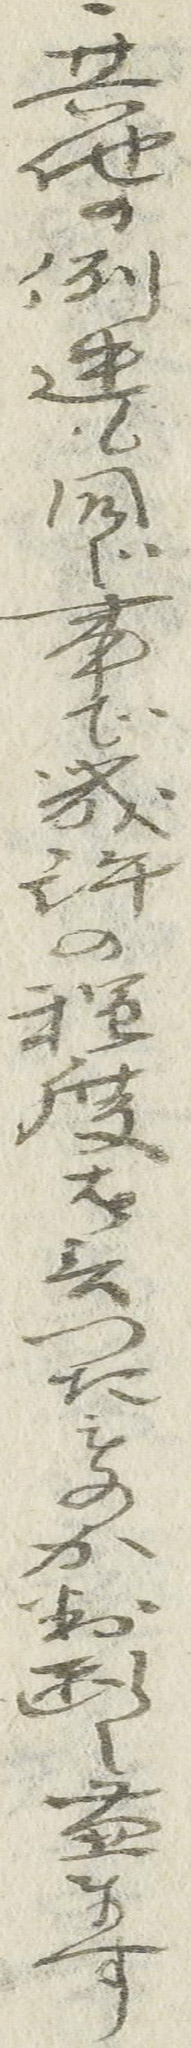一其他の例迚も同じ事で幾許の程度を云つたものか判断し兼ます
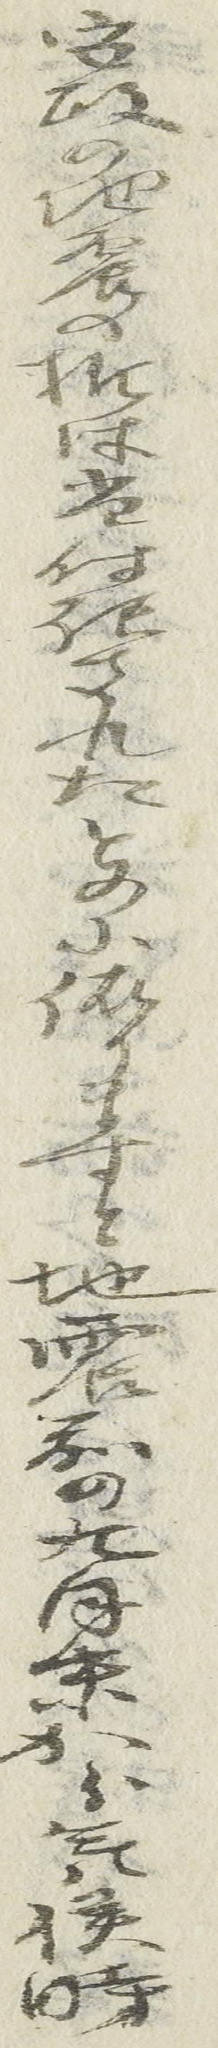安政の地震の折は当時記されたとのに依りますと地震前の九月末から気候時
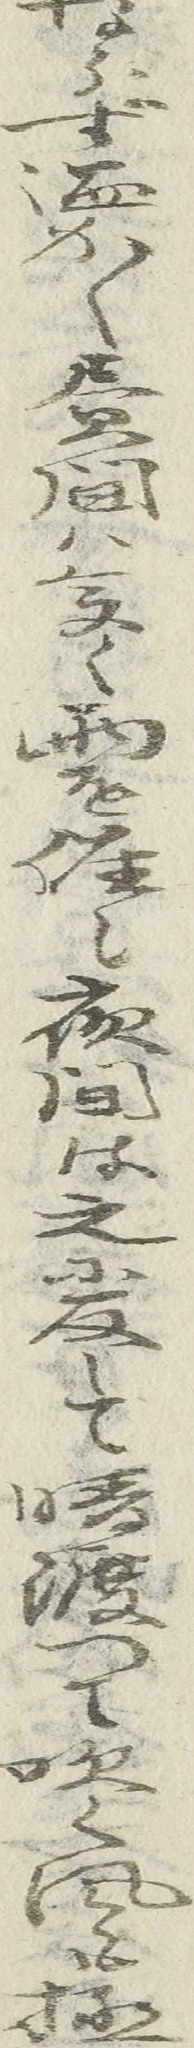ならず温かく昼間は多く雨を催し夜間は之に反して晴渡つて吹く風も極

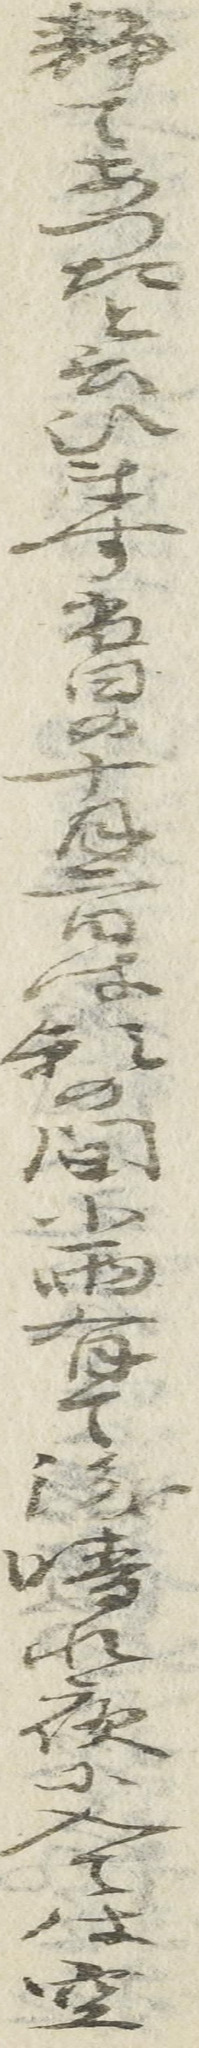静てあつたと云ひます当日の十月二日は朝の間小雨有て後晴れ夜に入ては空
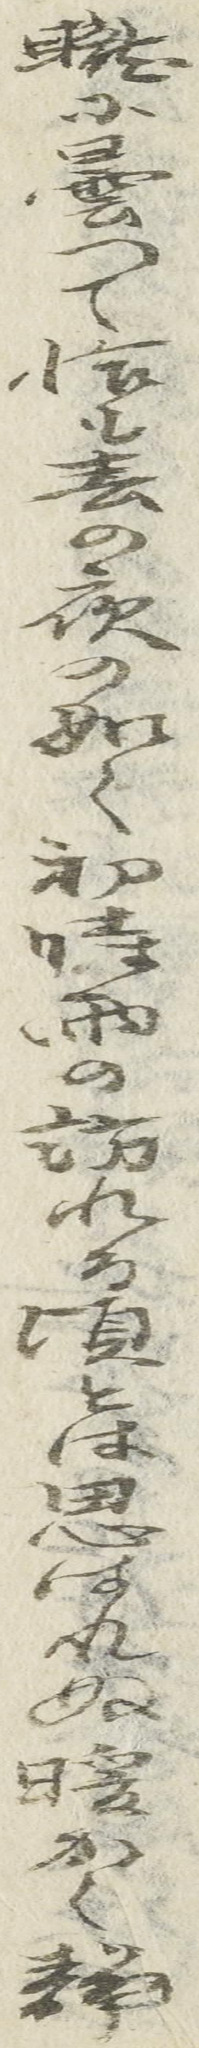朧？に曇つて恰も春の夜の如く初時雨の訪れる頃とは思はれぬ暖かく静
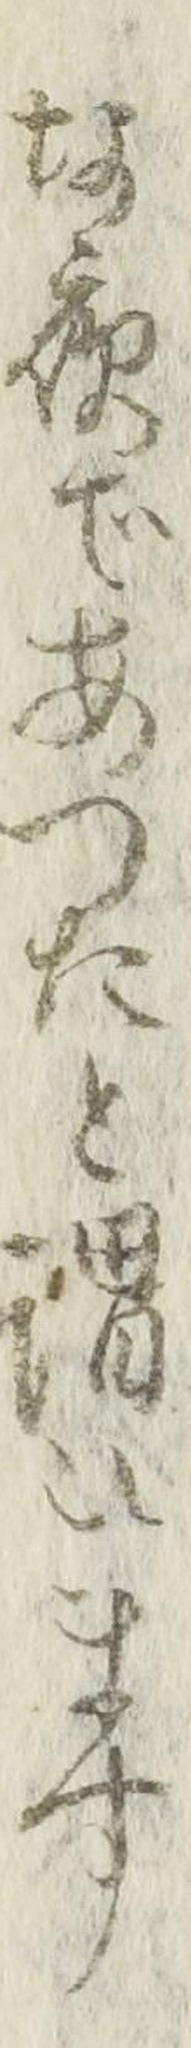な夜であつたと謂ひます
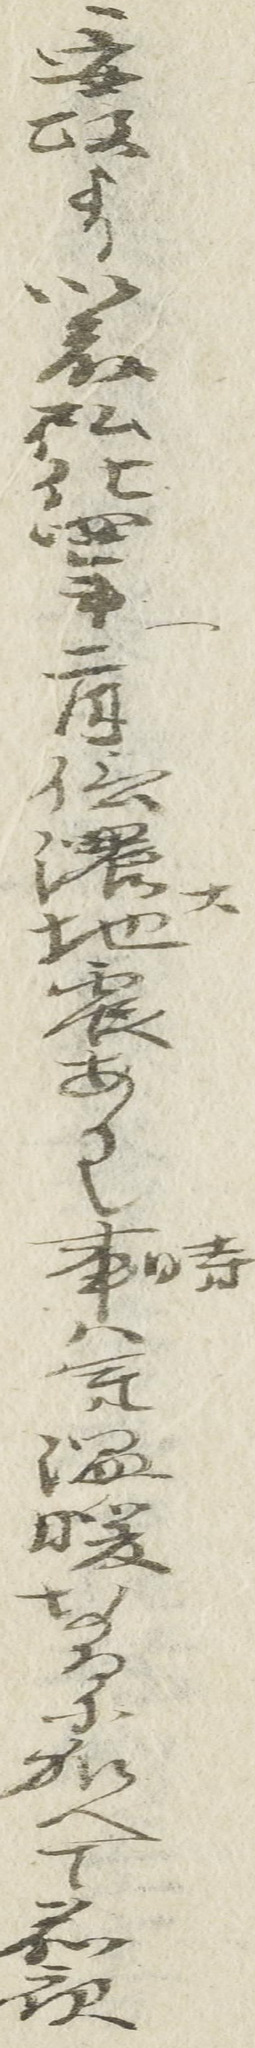一安政より以前弘化四年二月信濃地震ありし事は気温暖なるに加へて前夜
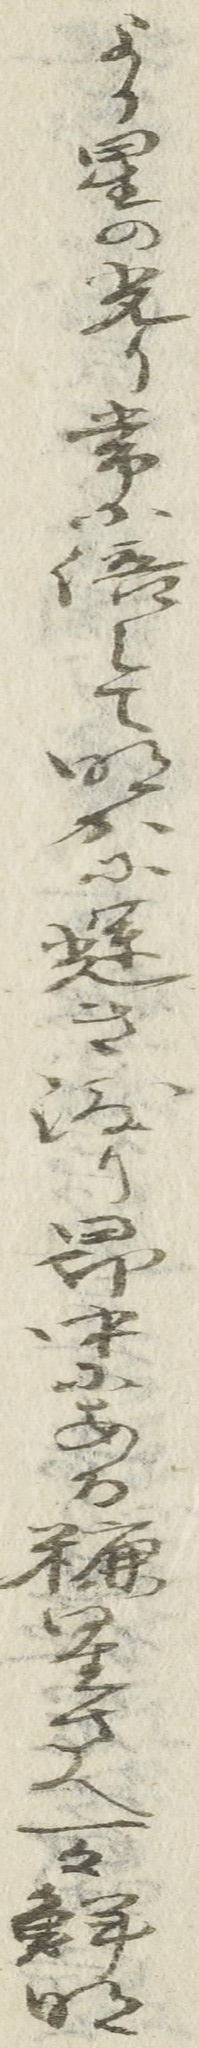より星の光り常に倍して明かに輝き渡り昴中にある糠星さへ一々鮮明
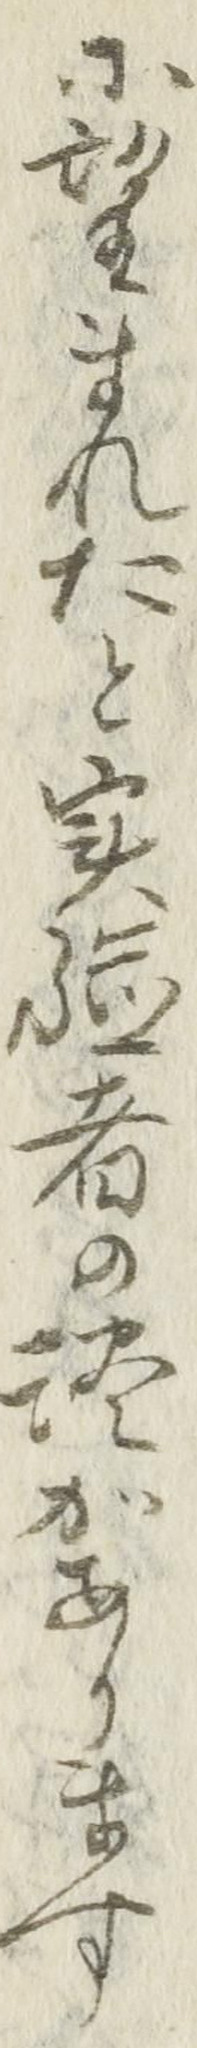に望まれたと実験者の語があります
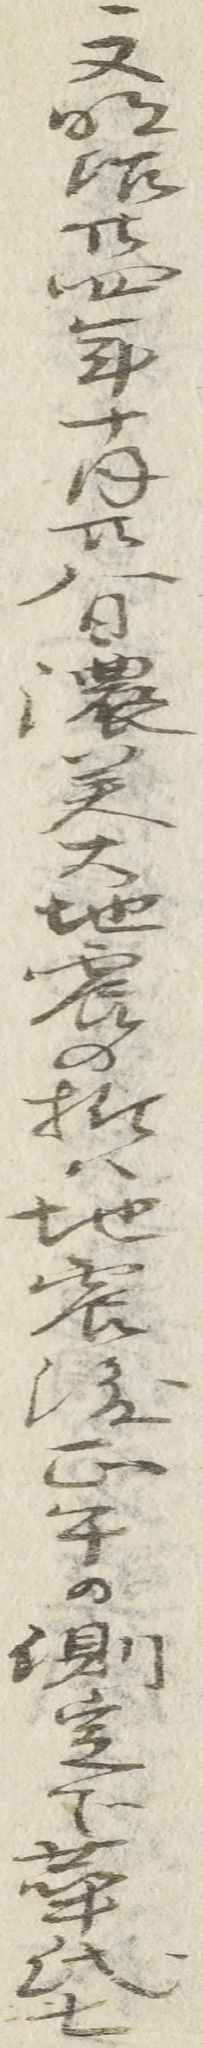一又明治廿四年十月廿八日濃美大地震の折は地震前正午の測定で華氏七
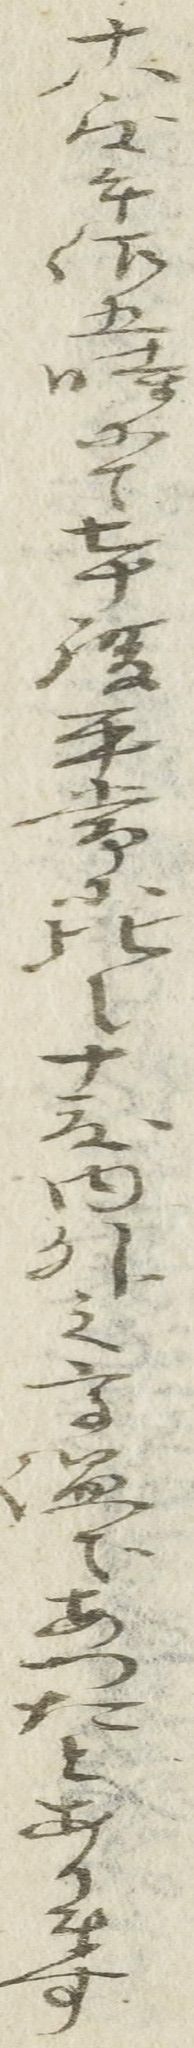十八度午後五時にて七十度平常に比し十度内外の高温であつたとあります
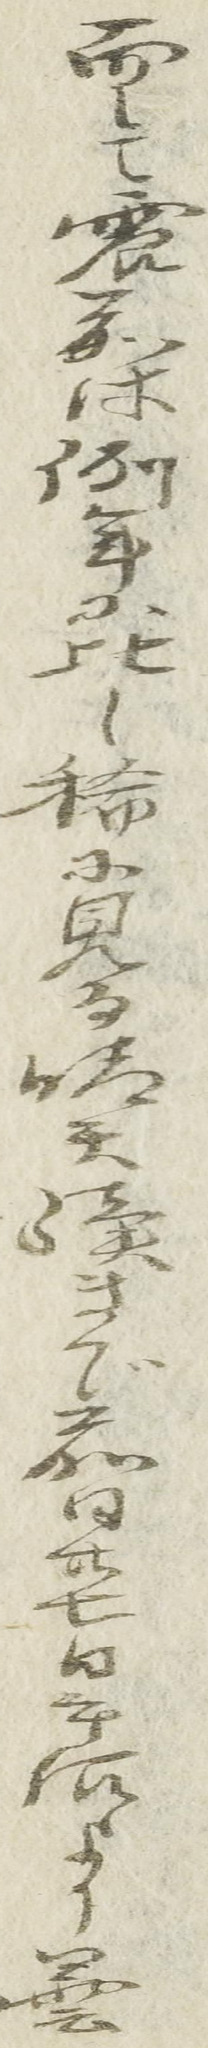而して震前は例年に比し稀に見る晴天続きで前日廿七日午後より曇
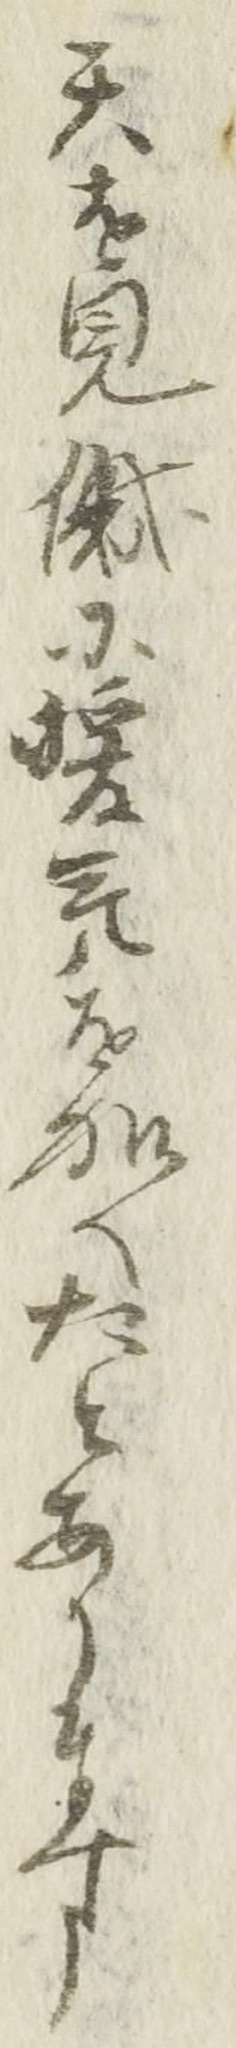天を見俄に暖気を加へたとあります
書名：地震前兆集　全
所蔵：東京大学地震研究所図書室 Earthquake Research Institute Library, The University of Tokyo, JAPAN
